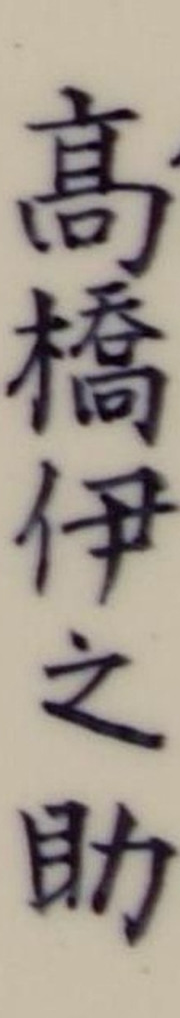高橋伊之助
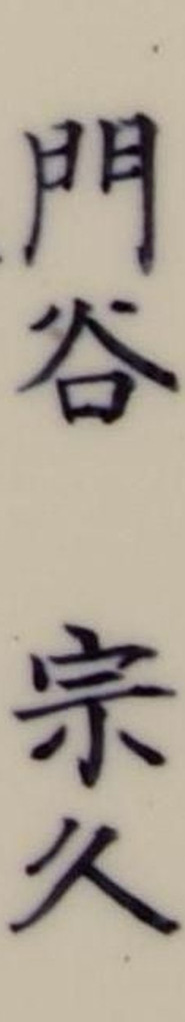門谷宗久
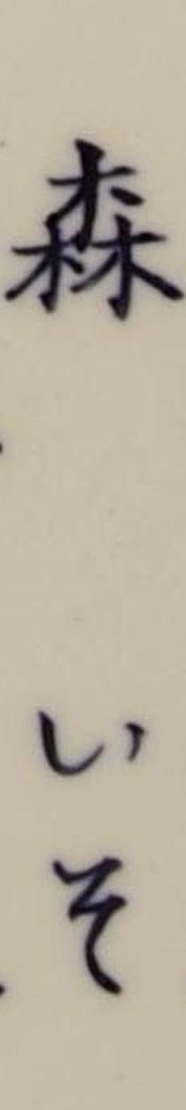森いそ
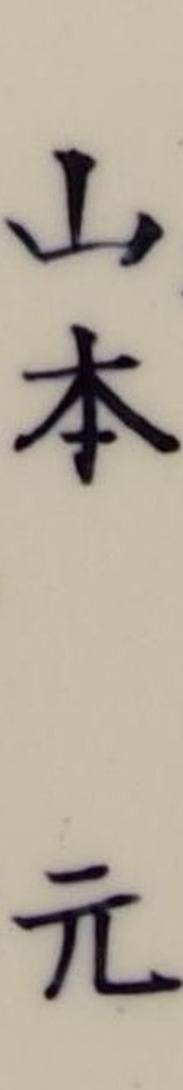山本元
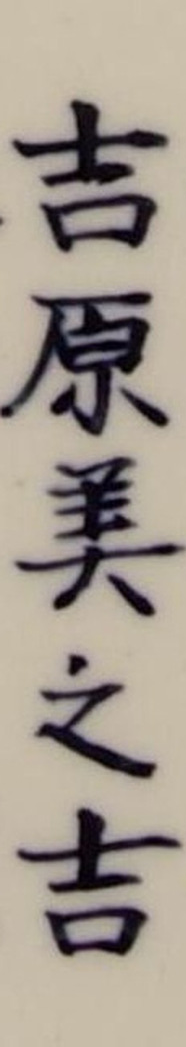吉原美之吉
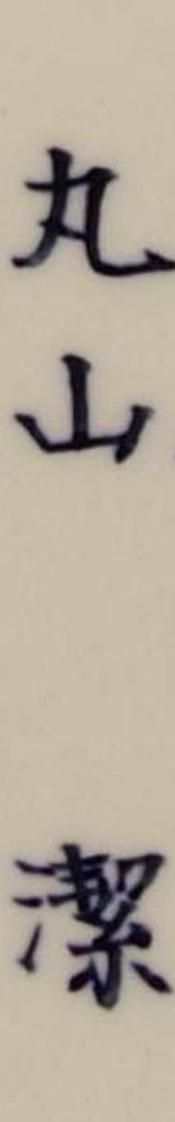丸山潔
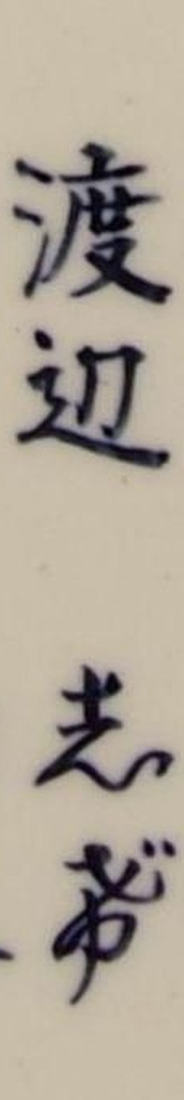渡辺しげ
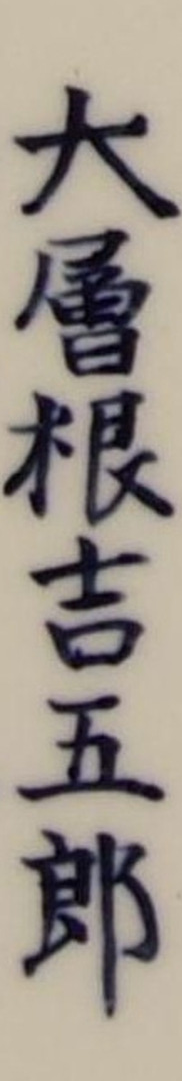大層根吉五郎
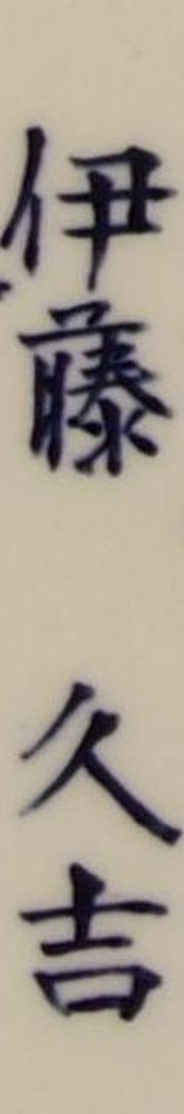伊藤久吉
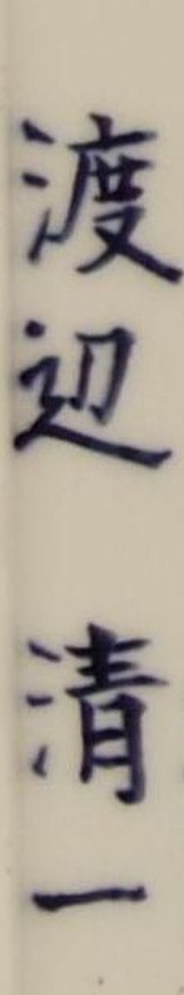渡辺清一

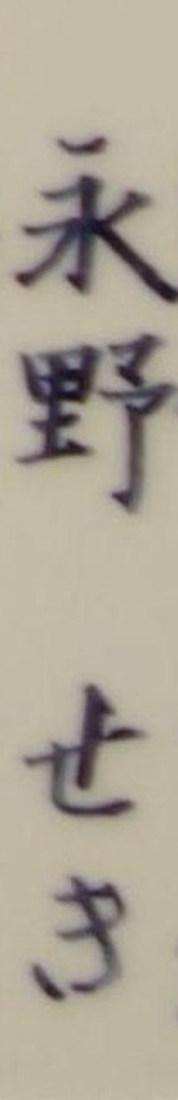永野せき
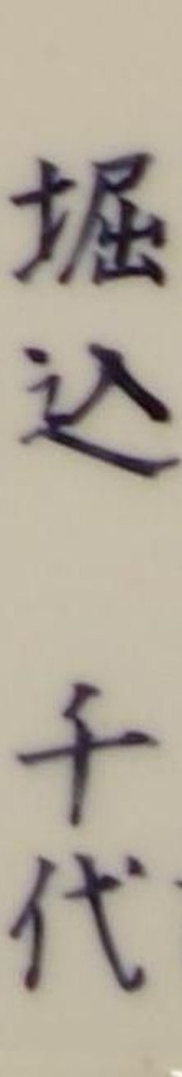堀込千代
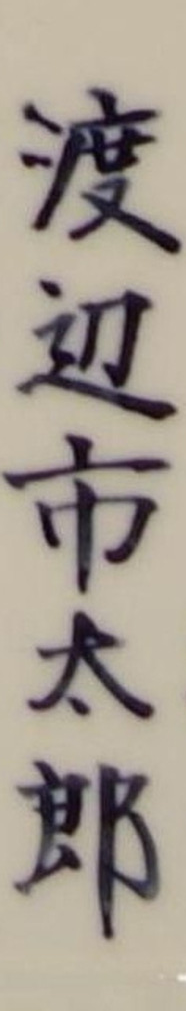渡辺市太郎
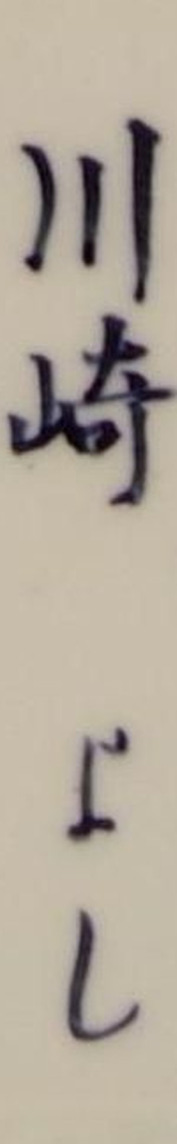川崎よし
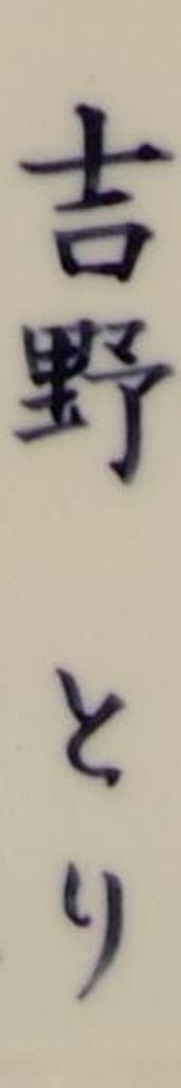吉野とり
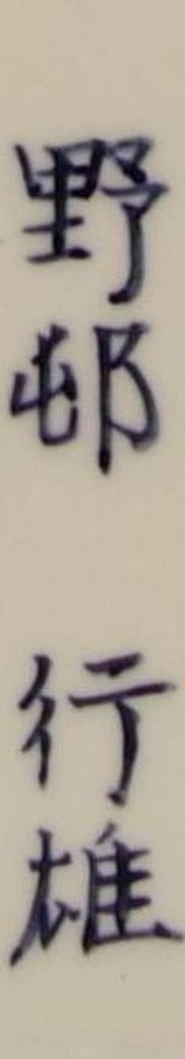野邨行雄
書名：E~L
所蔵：高野山金剛峯寺
